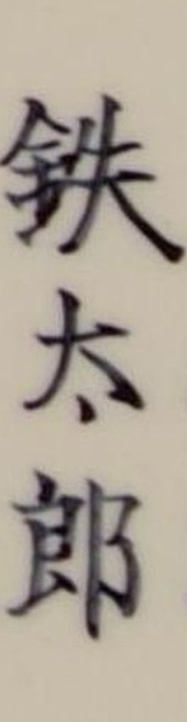鉄太郎
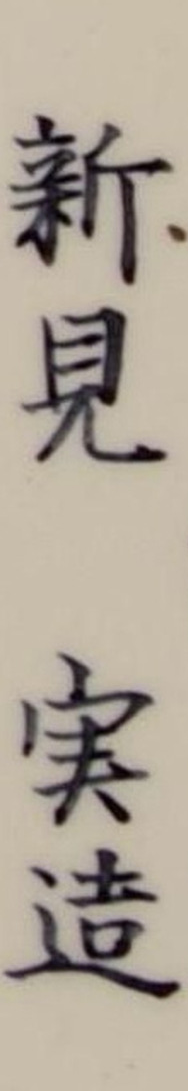新見実造
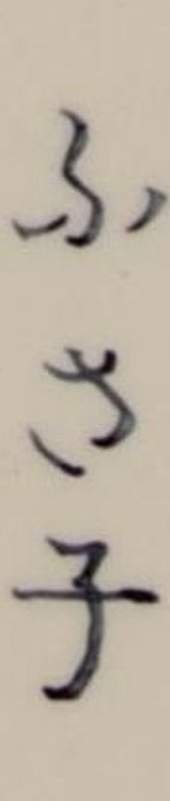ふさ子
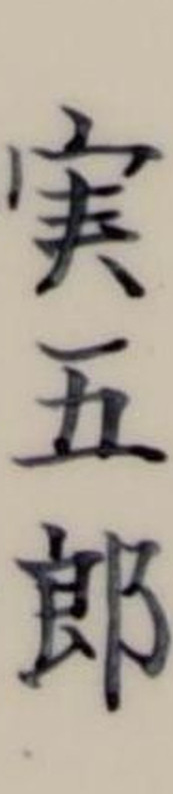実五郎
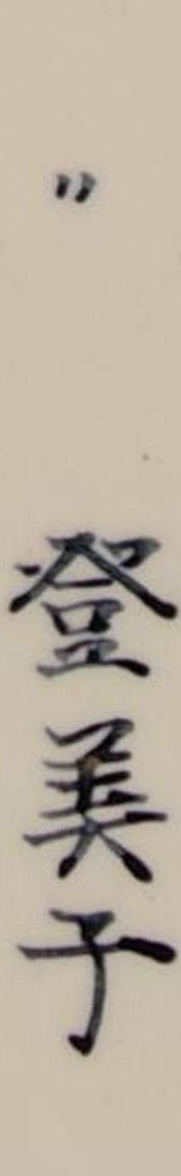登美子
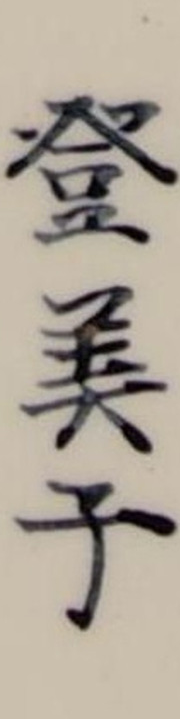登美子
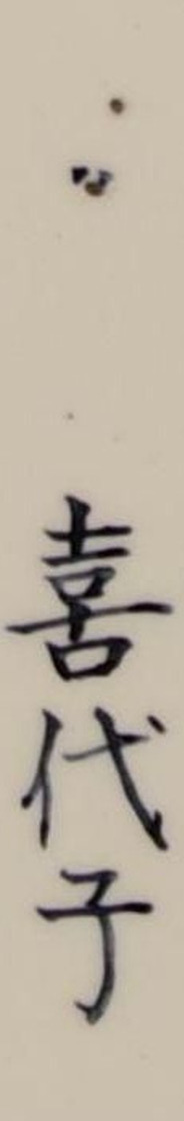喜代子
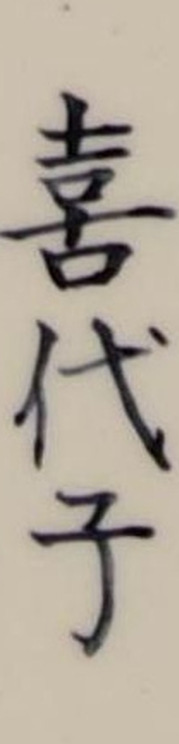喜代子
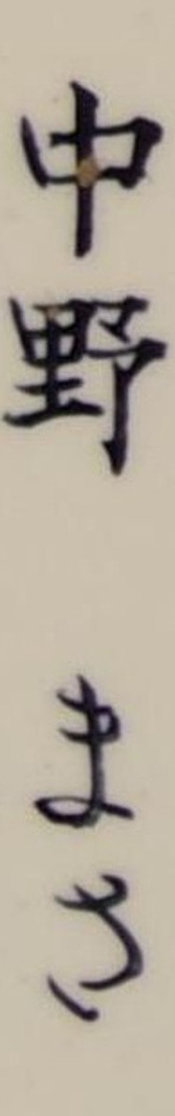中野まさ
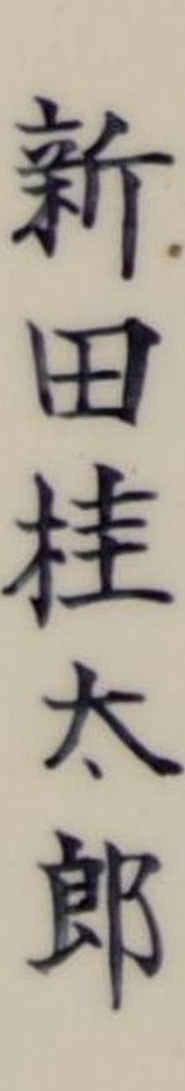新田桂太郎
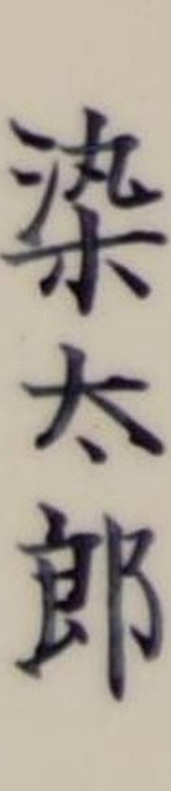染太郎
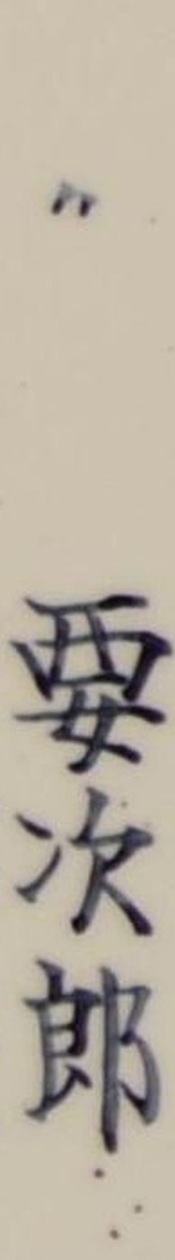要次郎
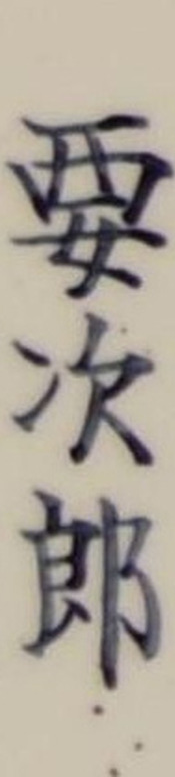要次郎

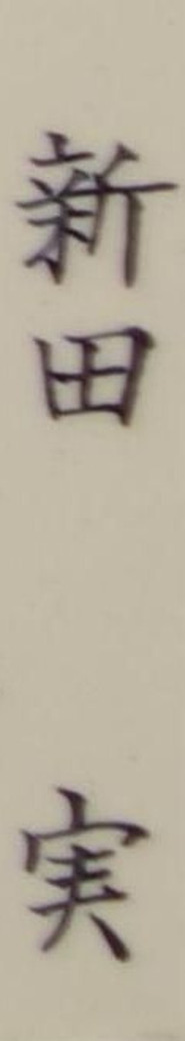新田実
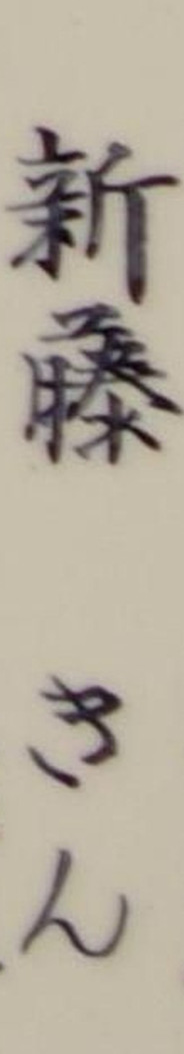新藤きん
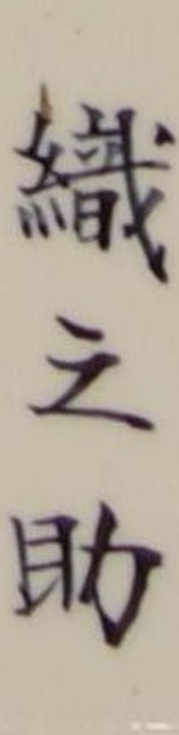織之助
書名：E~L
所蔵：高野山金剛峯寺
